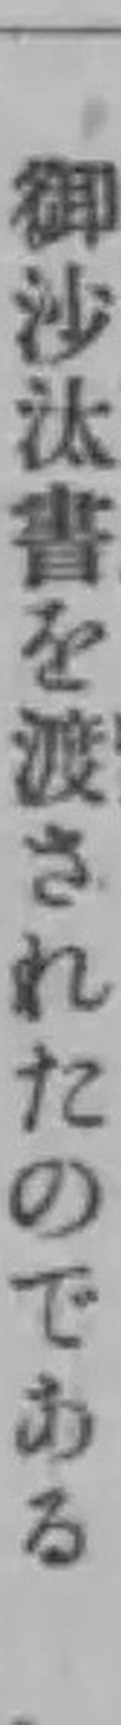御沙汰書を渡されたのである
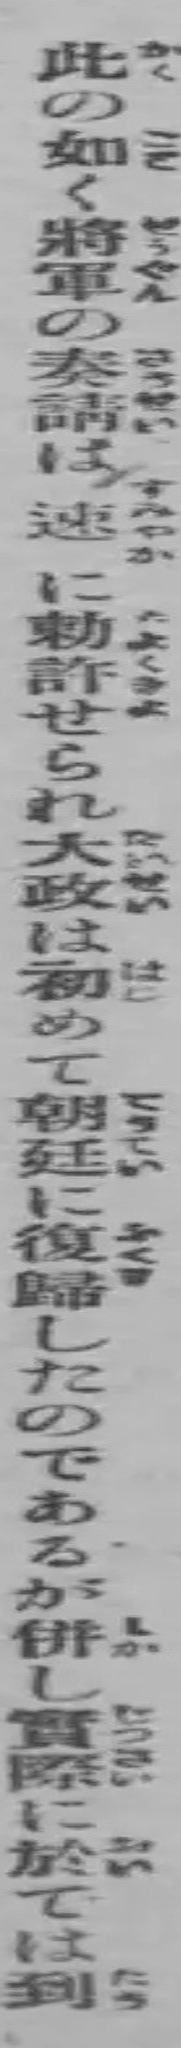此の如く将軍の奏請は速に勅許せられ大政は初めて朝廷に復帰したのであるが併し実際に於ては到
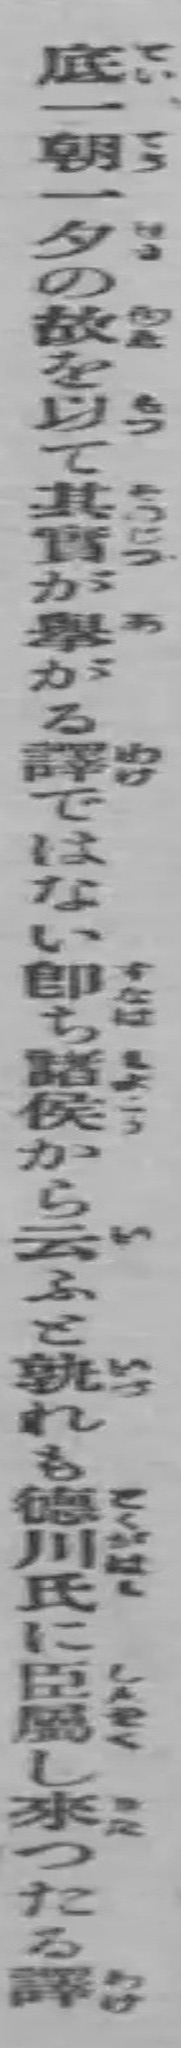底一朝一夕の故を以て其実が挙がる訳ではない即ち諸侯から云ふと孰れも徳川氏に臣属し来つたる訳
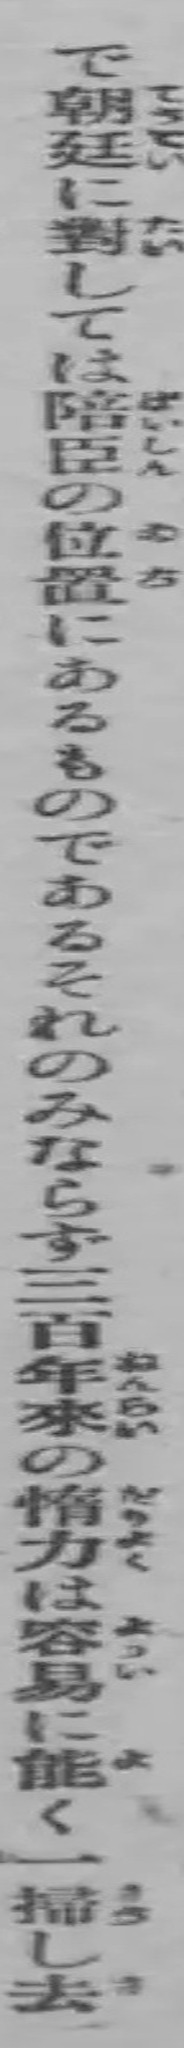で朝廷に対しては陪臣の位置にあるものであるそれのみならず三百年来の惰力は容易に能く一掃し去
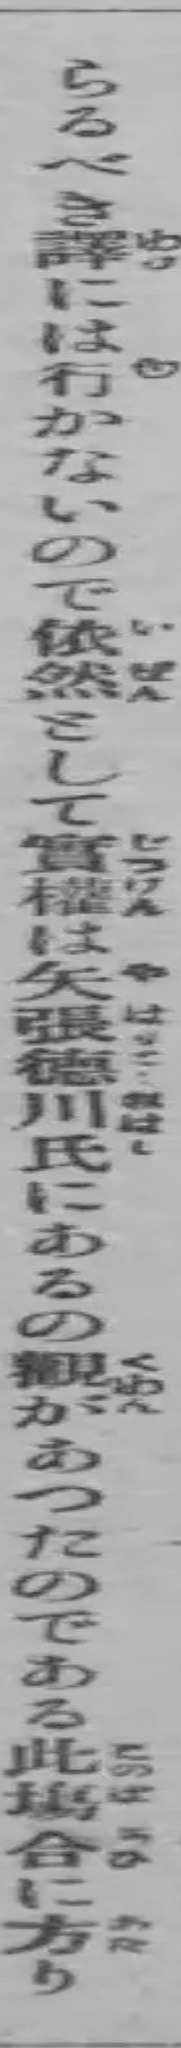らるべき訳には行かないので依然として実権は矢張徳川氏にあるの観があつたのである此場合に方り
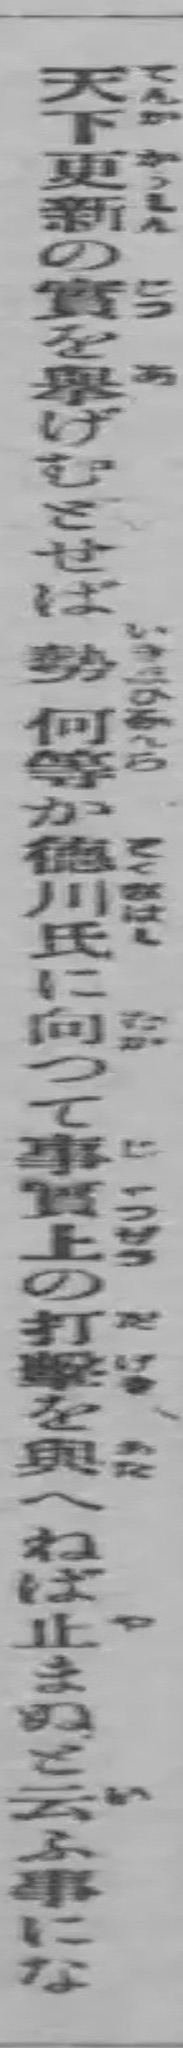天下更新の実を挙げむとせば勢何等か徳川氏に向つて事実上の打撃を与へねば止まぬと云ふ事にな
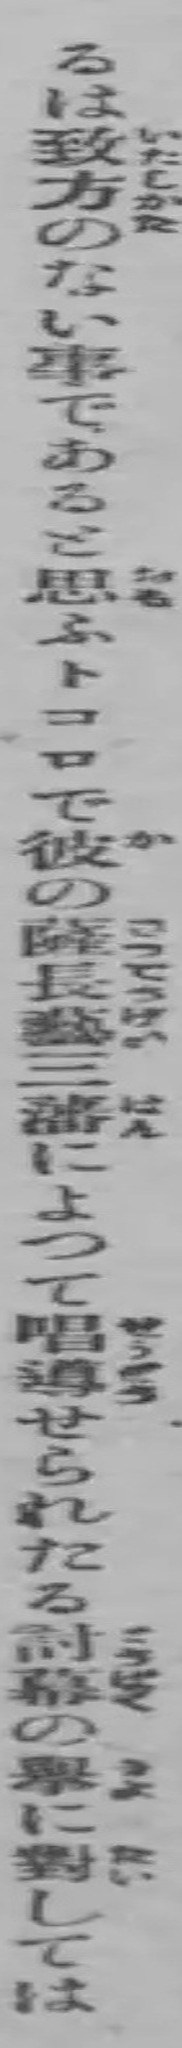討幕の密勅るは致方のない事であると思ふトコロで彼の薩長芸三藩によつて唱導せられたる討幕の挙に対しては
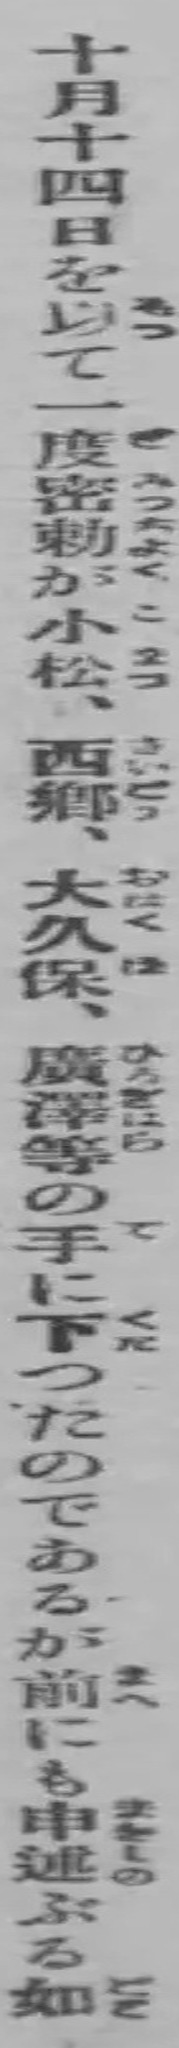十月十四日を以て一度密勅が小松、西郷、大久保、廣澤等の手に下つたのであるが前にも申述ぶる如
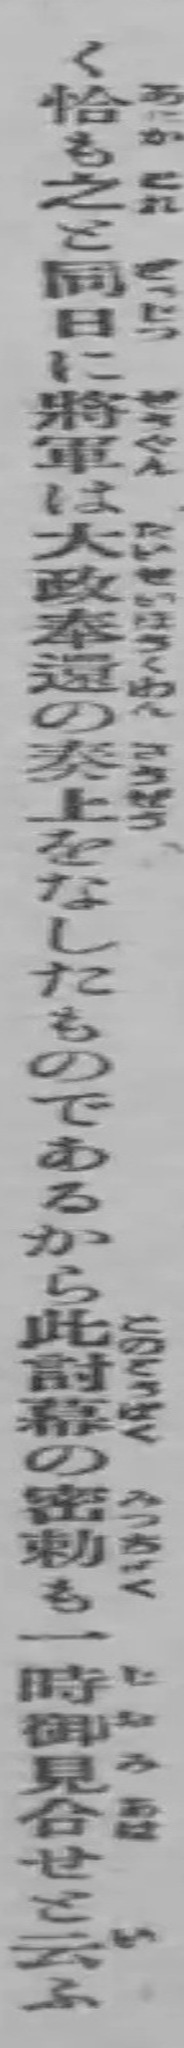く恰も之と同日に将軍は大政奉還の奏上をなしたものであるから此討幕の密勅も一時御見合せと云ふ
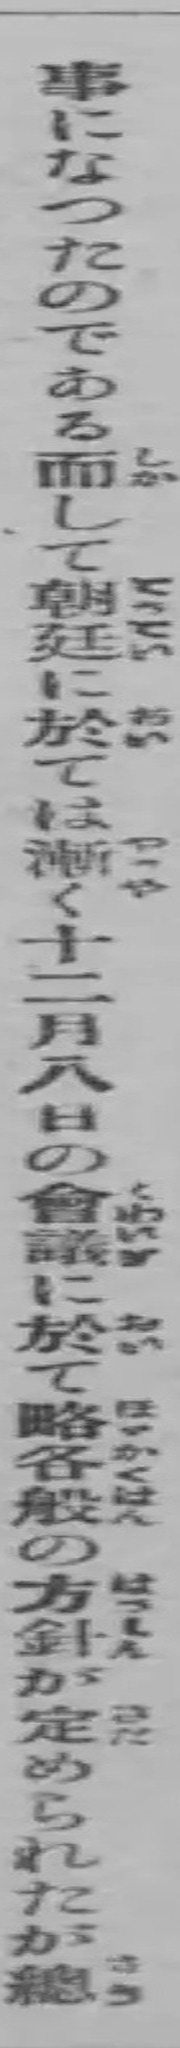事になつたのである而して朝廷に於ては漸く十二月八日の会議に於て略各般の方針が定められたが総
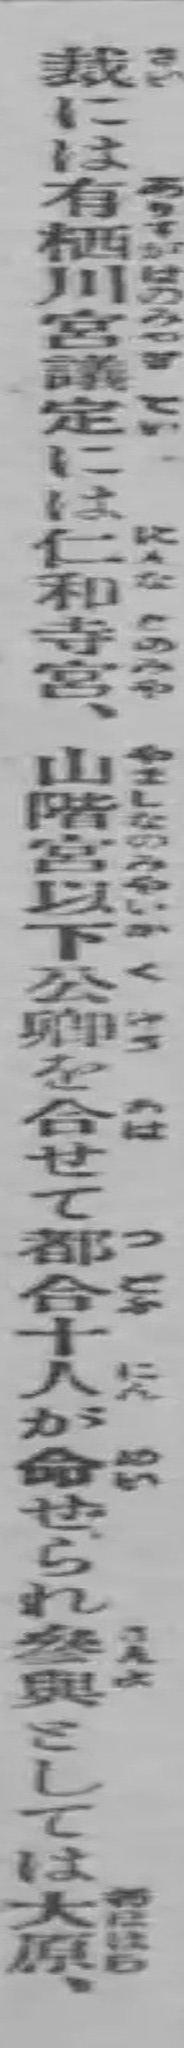裁には有栖川宮議定には仁和寺宮、山階宮以下公卿を合せて都合十人が命ぜられ参与としては大原、
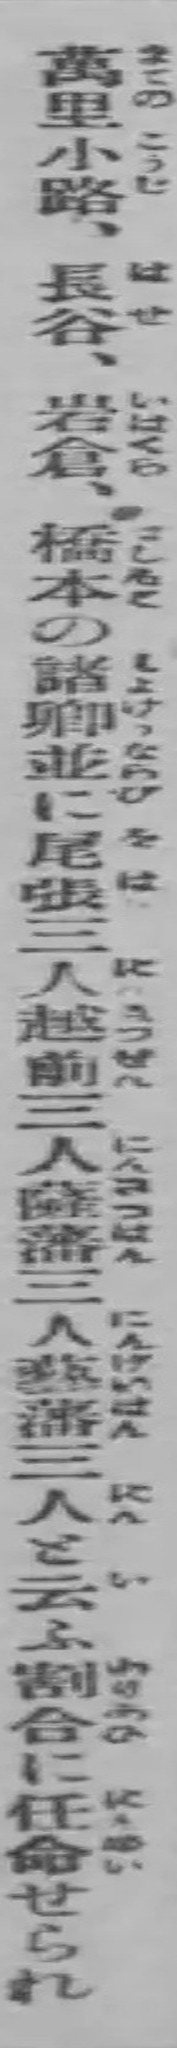萬里小路、長谷、岩倉、橋本の諸卿並に尾張三人越前三人薩藩三人芸藩三人と云ふ割合に任命せられ
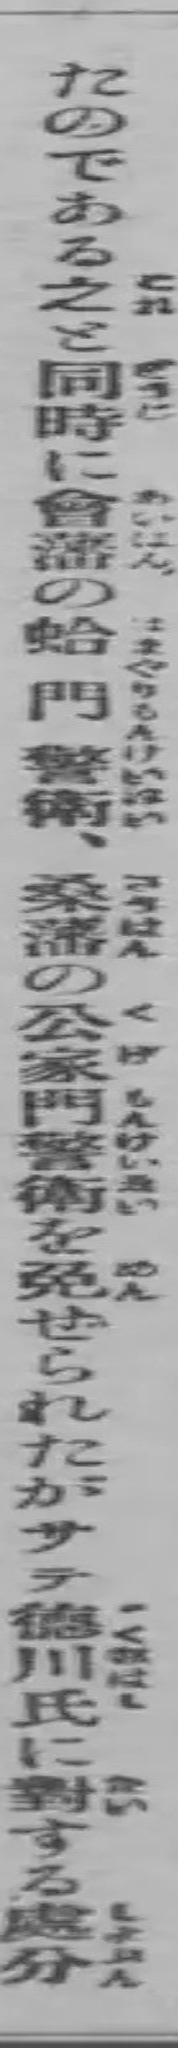たのである之と同時に会藩の蛤門警衛、桑藩の公家門警衛を免ぜられたがサテ徳川氏に対する処分
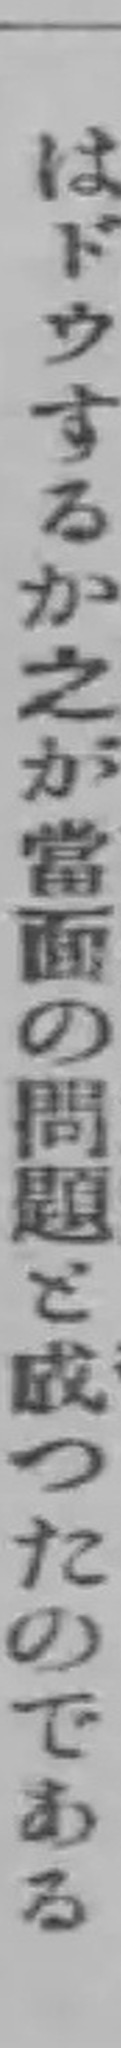はドウするか之が当面の問題と成つたのである

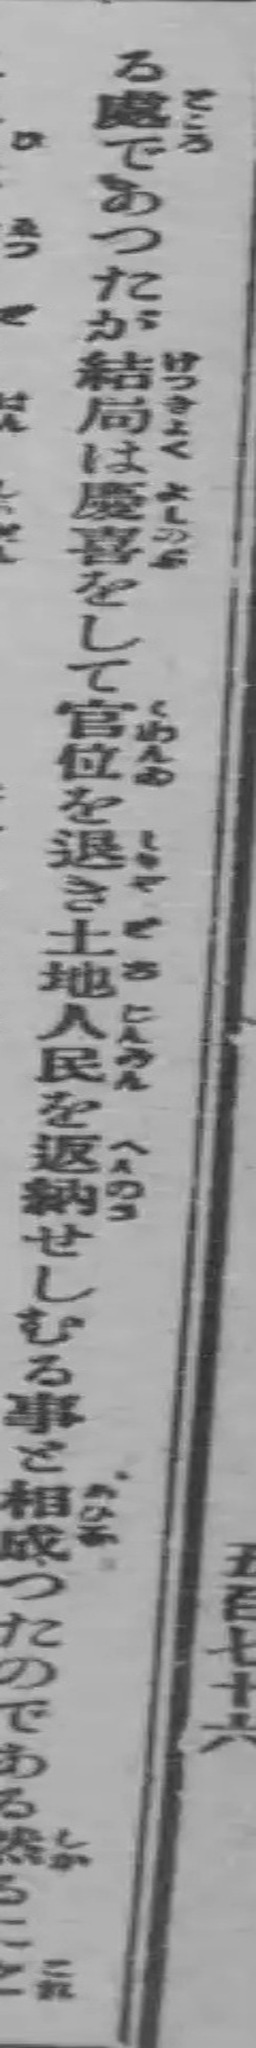る処であつたが結局は慶喜をして官位を退き土地人民を返納せしむる事と相成つたのである然るに之
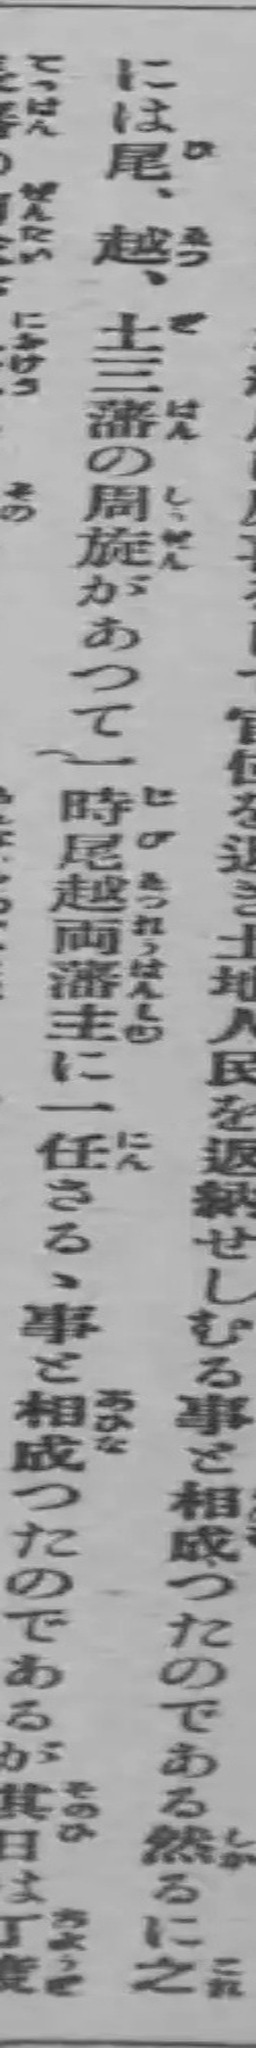には尾、越、土三藩の周旋があつて一時尾越両藩主に一任さるゝ事と相成つたのであるが其日は丁度
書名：豊橋市史談
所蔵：国立国会図書館 National Diet Library, JAPAN
